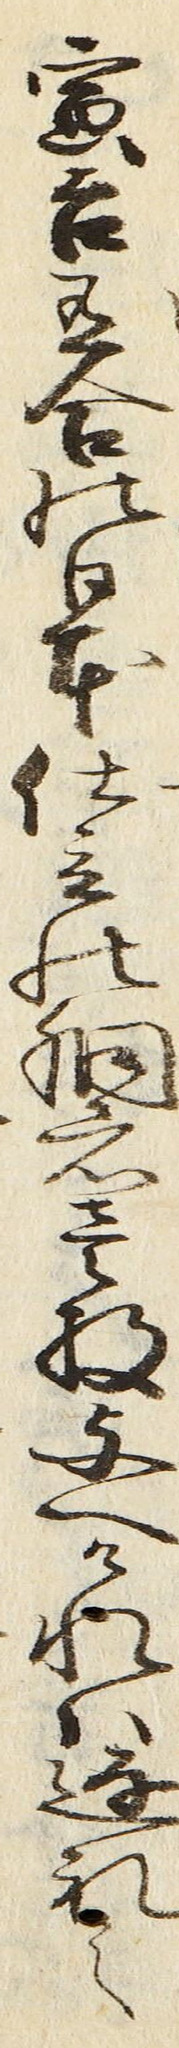寅吉有合の日本仕立の胴着壱枚与へけれハ返礼之
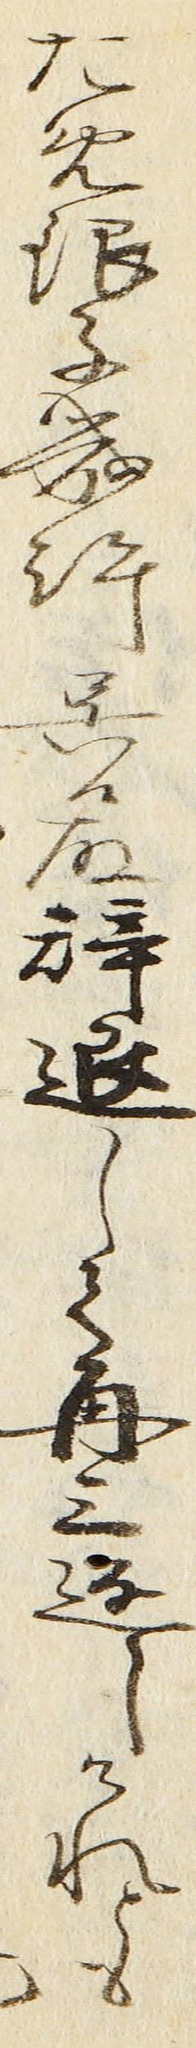ため銀子幾許呉候故辞退して再三返しけれとも
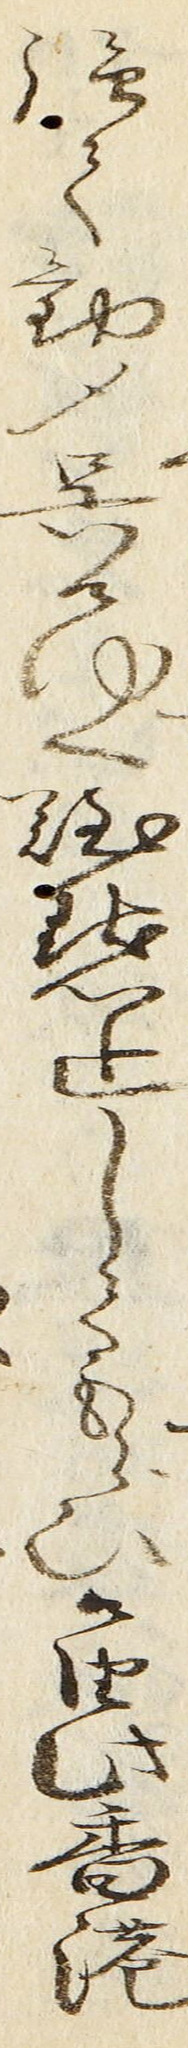強く勧メ呉候ゆへ難黙止してもらひ候由此香港
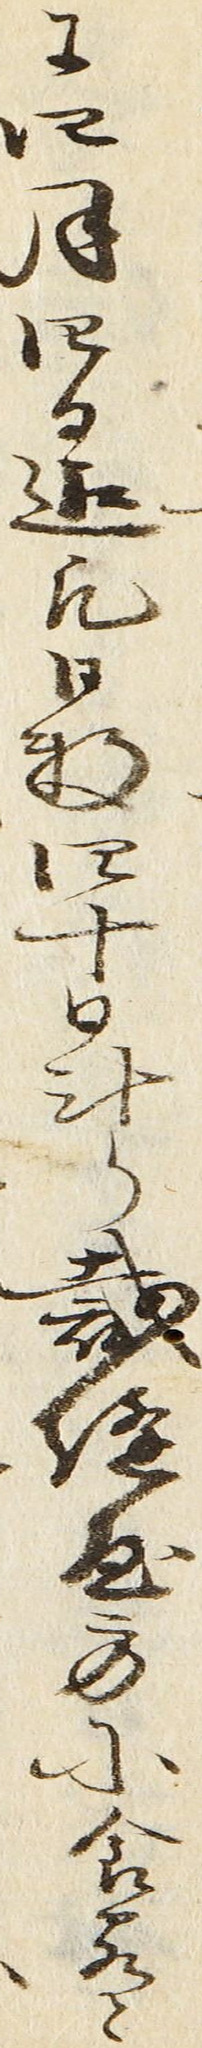に四月四日迄凡日数四十日計り裁縫屋方に食客と
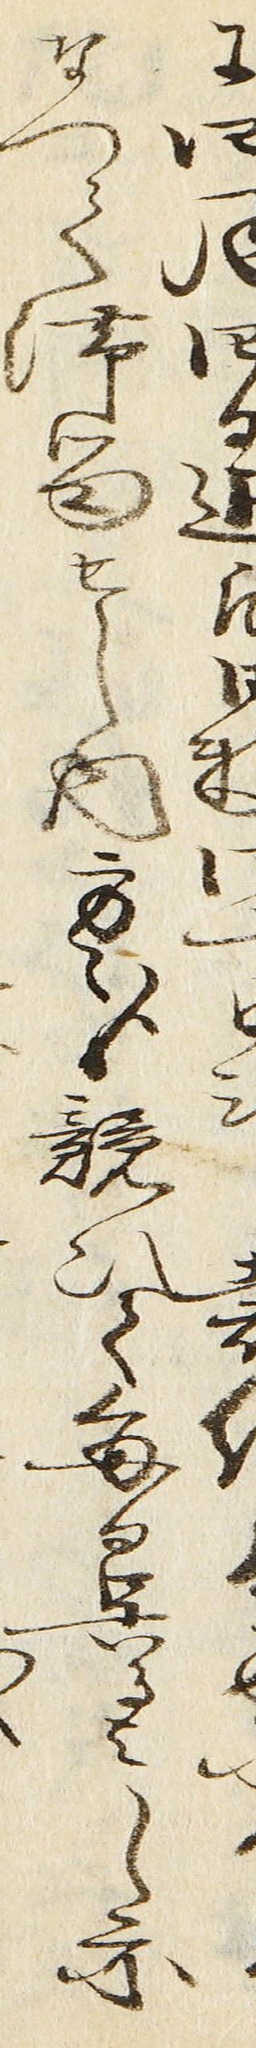なつて滞留セし内方々ゟ競ひて毎日呉るよし亦
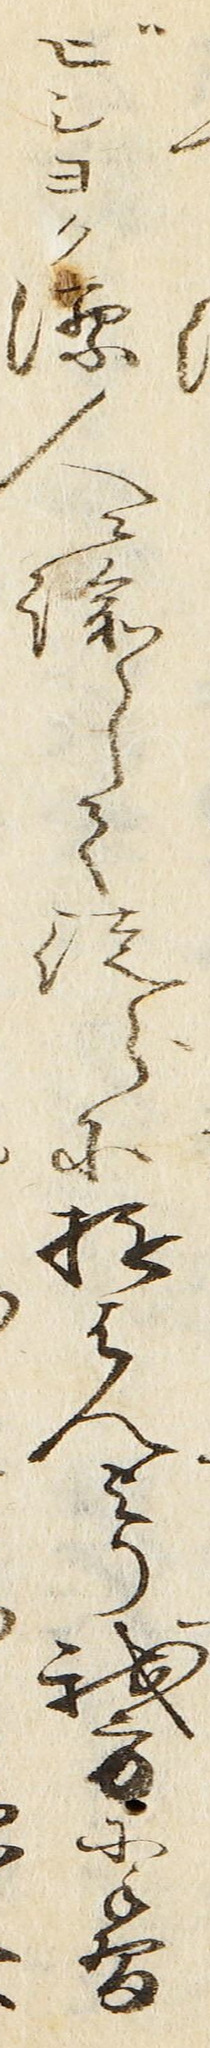ビシヨク漂人ニ諭して徒らに遊はんより我方に手習
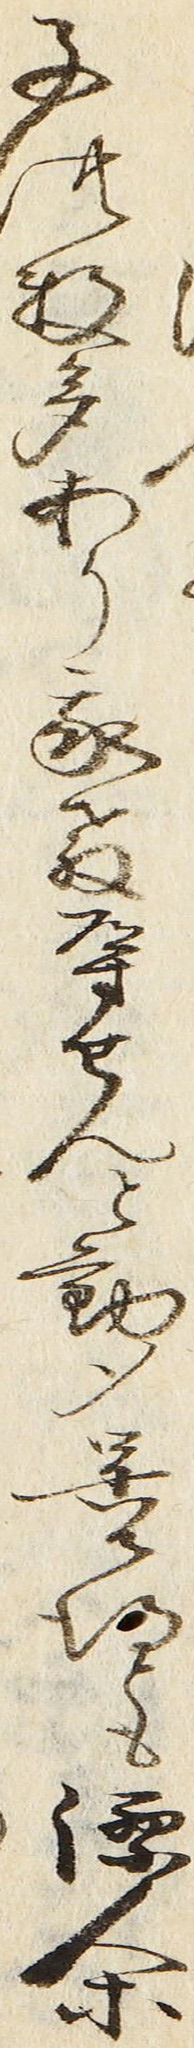子供数多あり我教導せんと勧メ呉候得とも漂人等
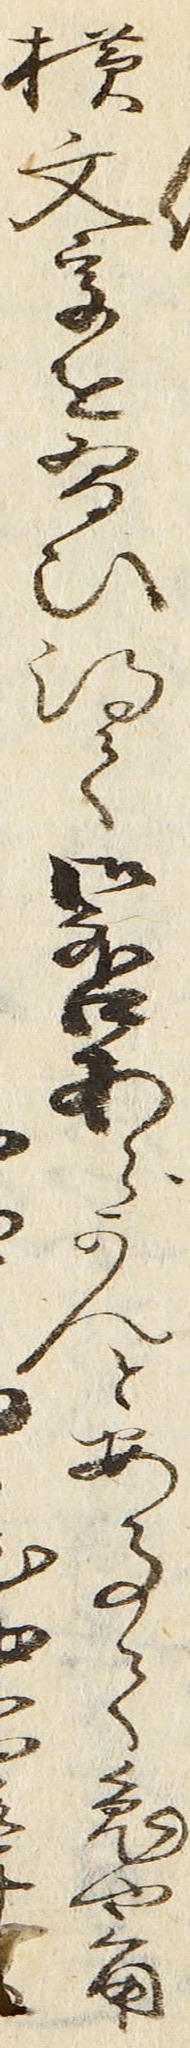横文字を習ひ得て御咎あらかんと安事て兎や角
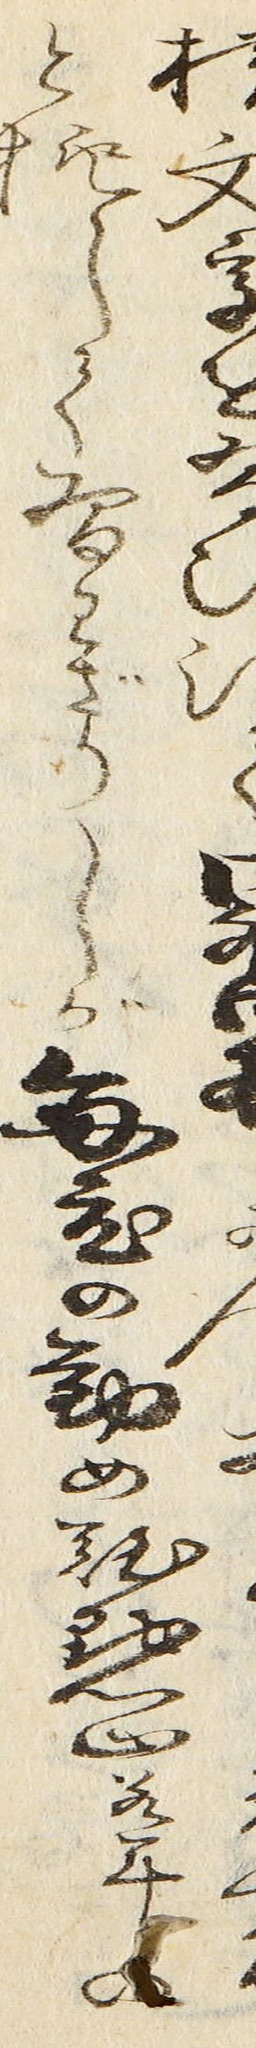と排して習わざりしが毎度の勧め難黙止若年の
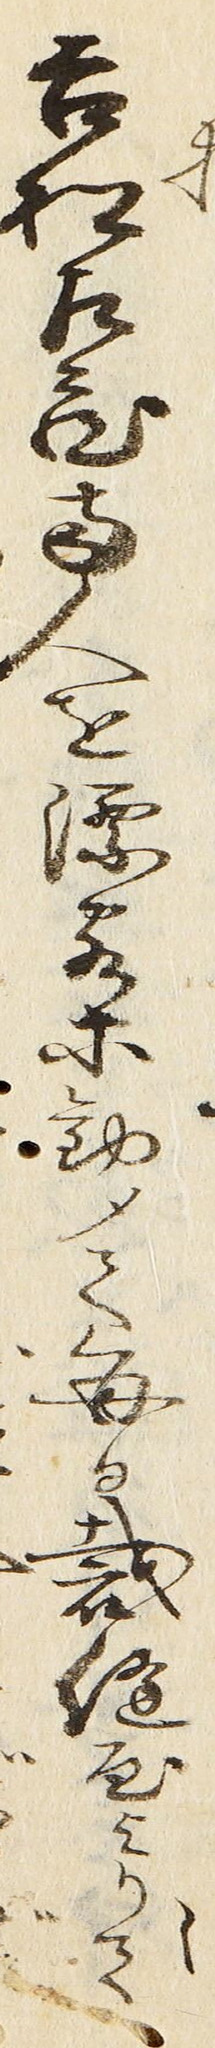吉松左蔵両人を漂客等勧メて毎日裁縫屋よりて
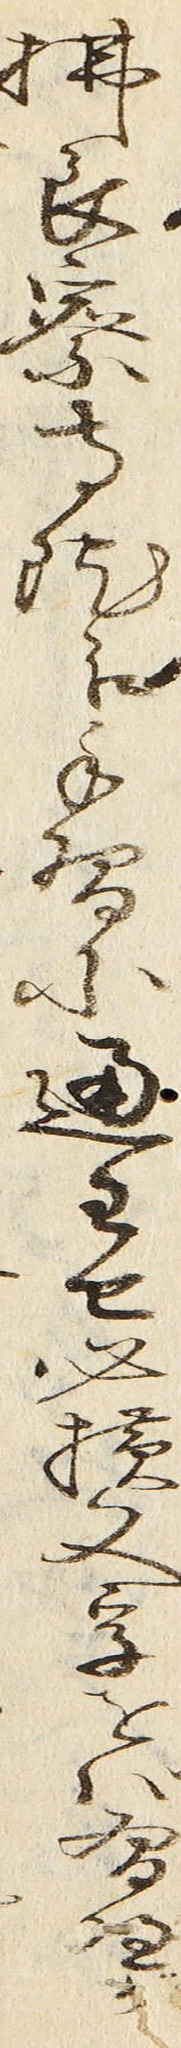払良察寺院え手習に通わセ必横文字をバ習べか
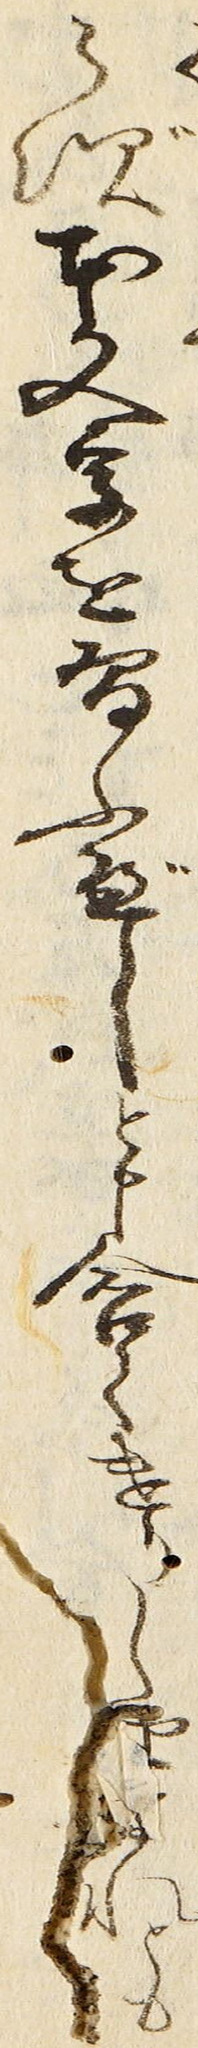らず本文字を習ふべしと申含て遣りし由なれとも
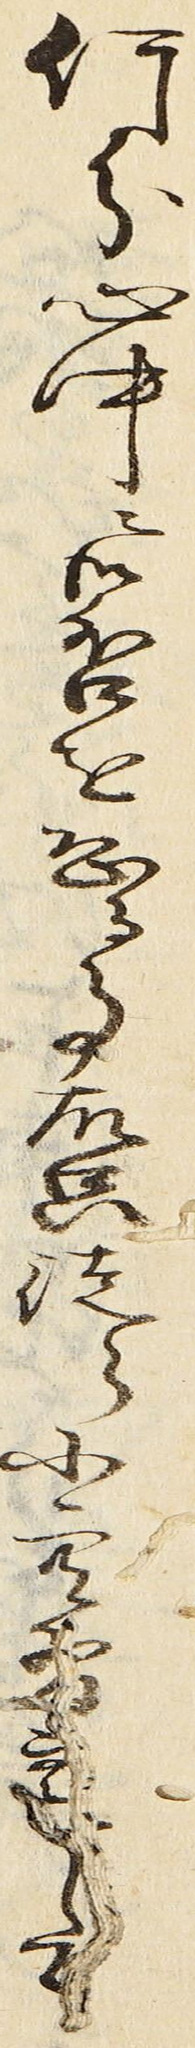何分心中ニ御咎を恐る事故只徒らにして
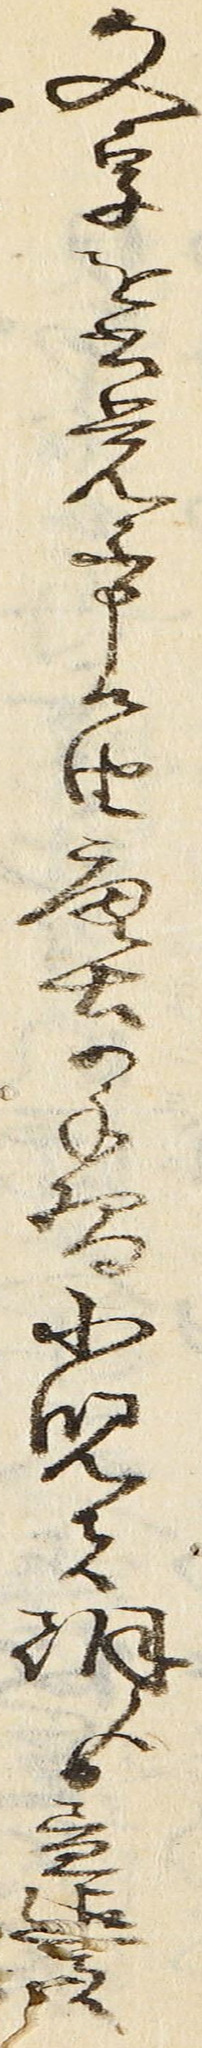文字を書覚不申候由唐土の手習小児は朝ゟ昼迄は
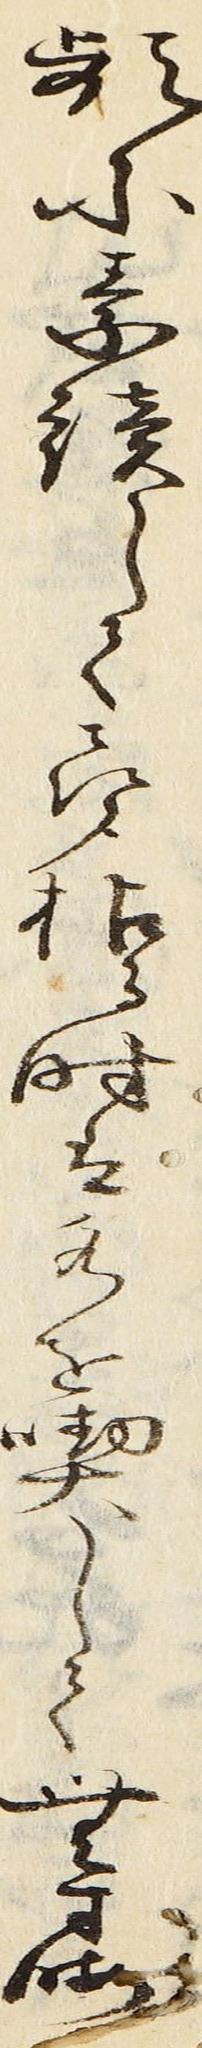頻に素読して声枯る時は水を喫して無寸暇
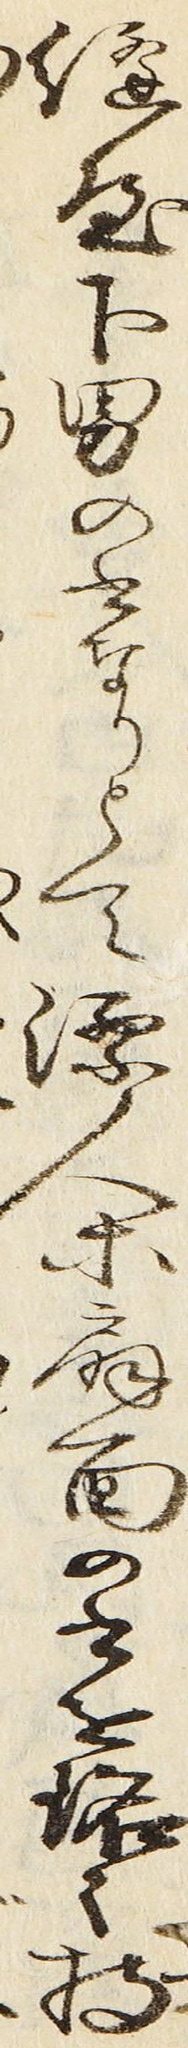縫屋下男の書なりとて漂人等扇面の書を銘々持
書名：亜墨利加漂流記聞
